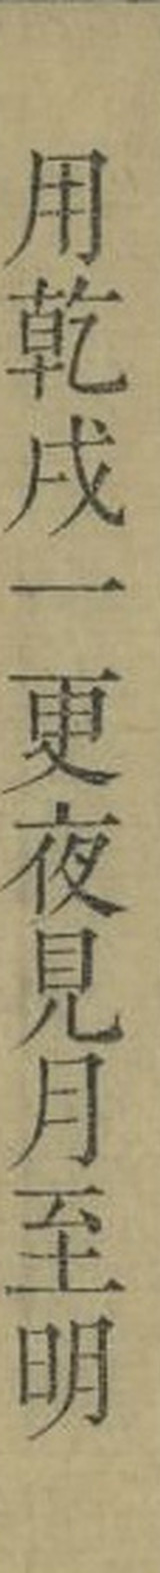用乾戌一更夜見月至明
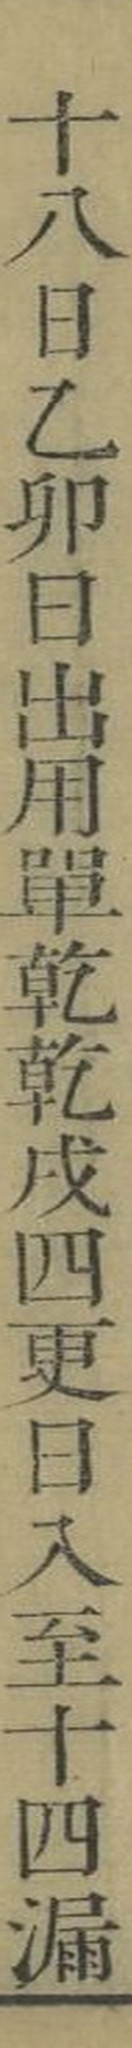十八日乙卯日出用單乾乾戌四更日入至十四漏
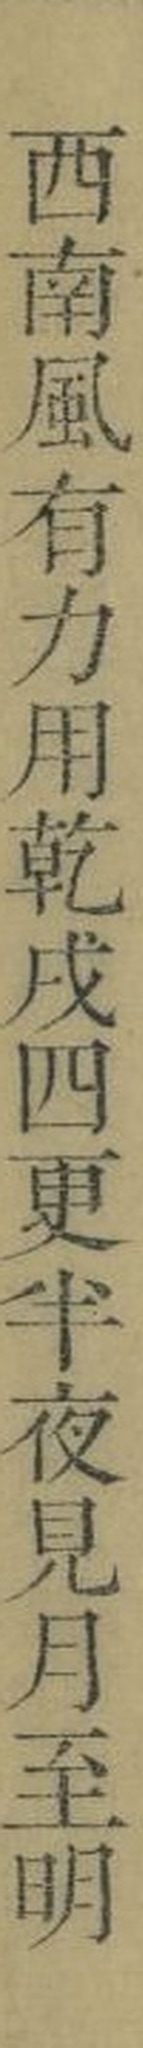西南風有力用乾戌四更半夜見月至明

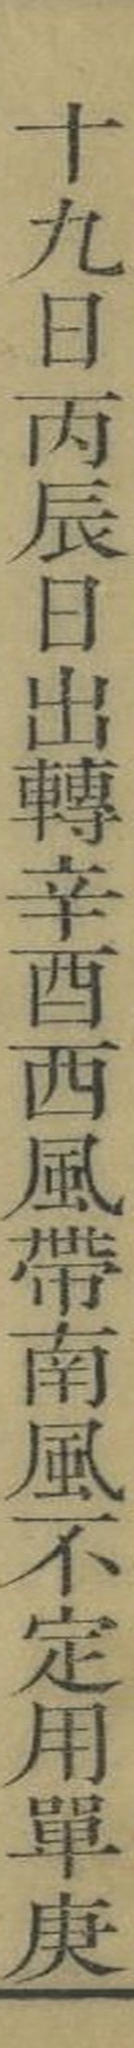十九日丙辰日出轉辛酉西風帶南風不定用單庚
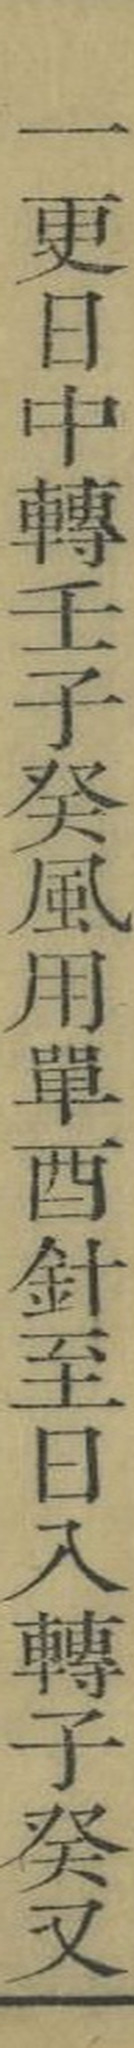一更日中轉壬子癸風用單酉針至日入轉子癸又
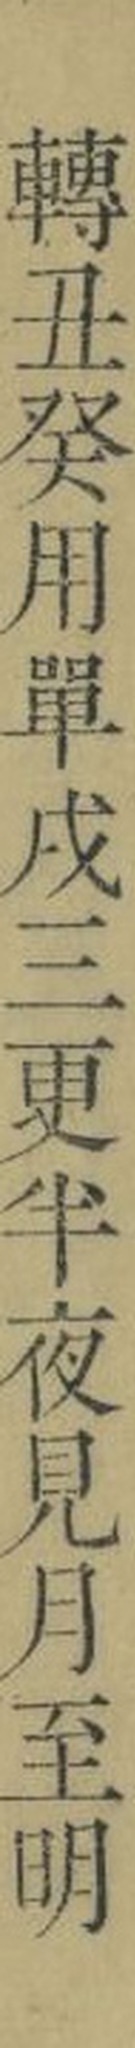轉丑癸用單戌三更半夜見月至明
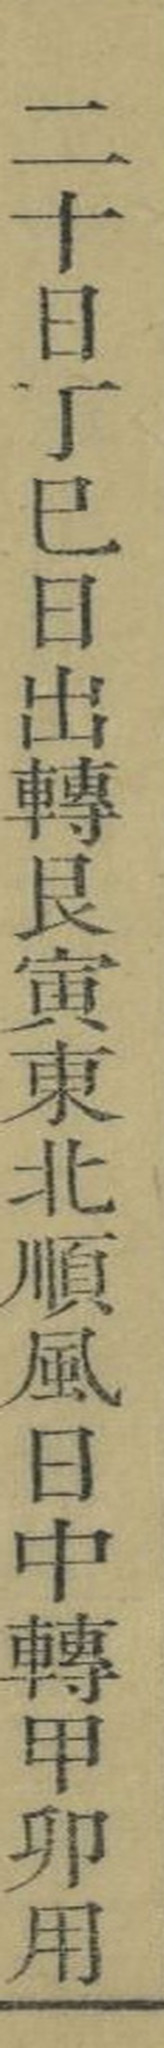二十日丁巳日出轉艮寅東北順風日中轉甲卯用
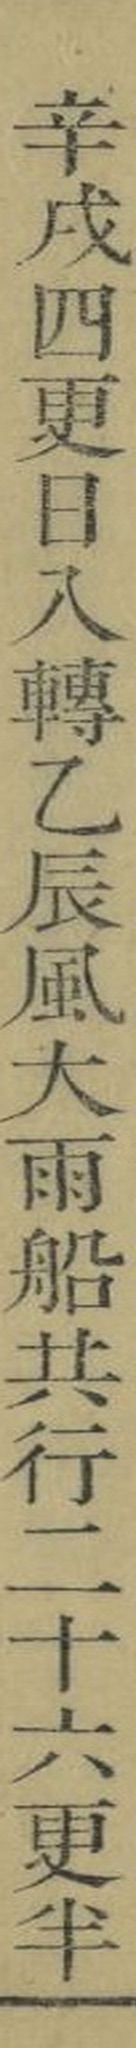辛戌四更日入轉乙辰風大雨船共行二十六更半
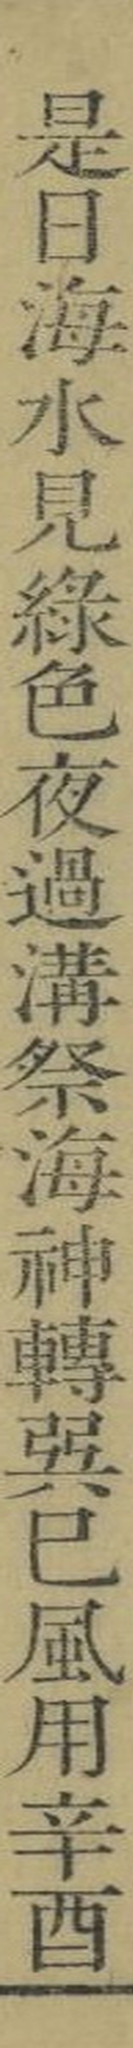是日海水見綠色夜過溝祭海神轉㢲巳風用辛酉
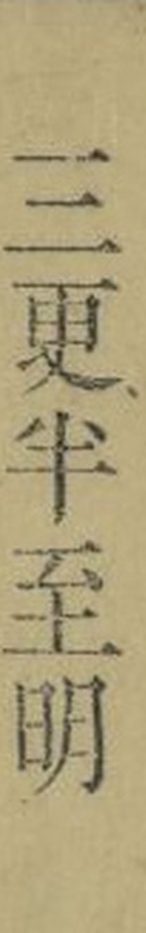三更半至明
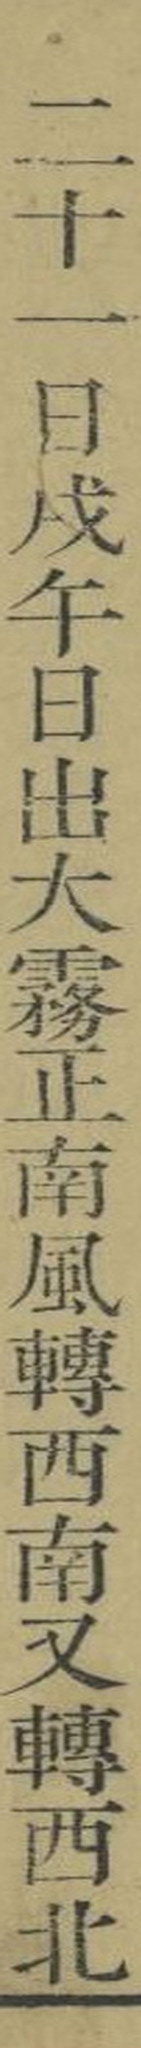二十一日戌午日出大霧正南風轉西南又轉西北
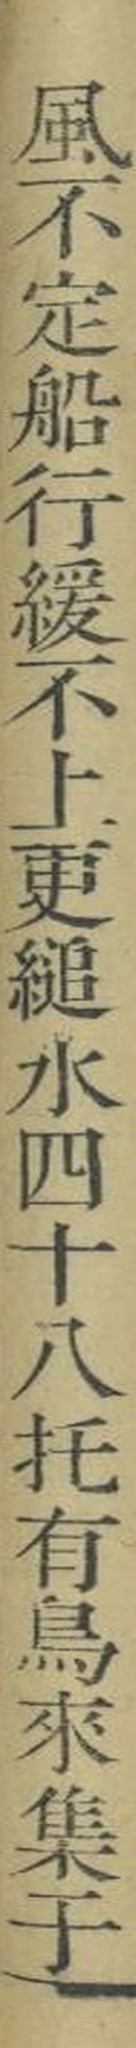風不定船行緩不上更縋水四十八托有鳥來集于
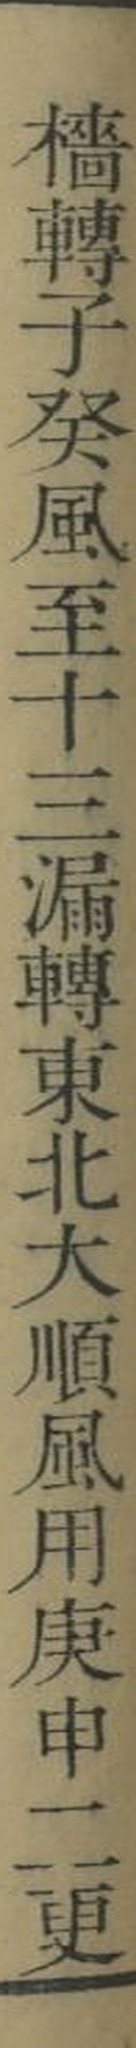檣轉子癸風至十三漏轉東北大順風用庚申二更
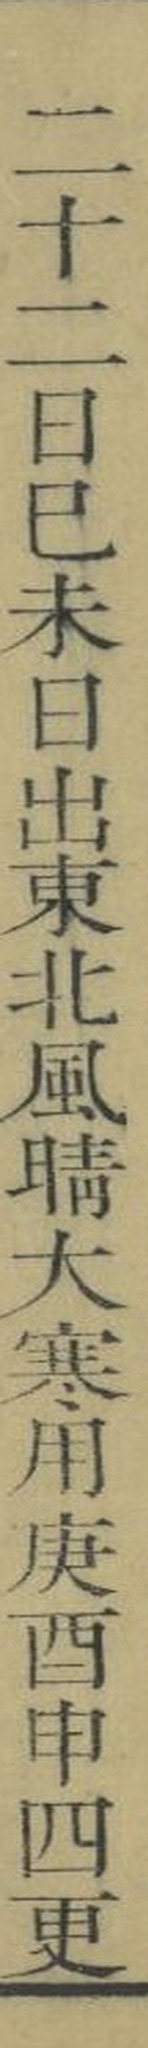二十二日巳未日出東北風晴大寒用庚酉申四更
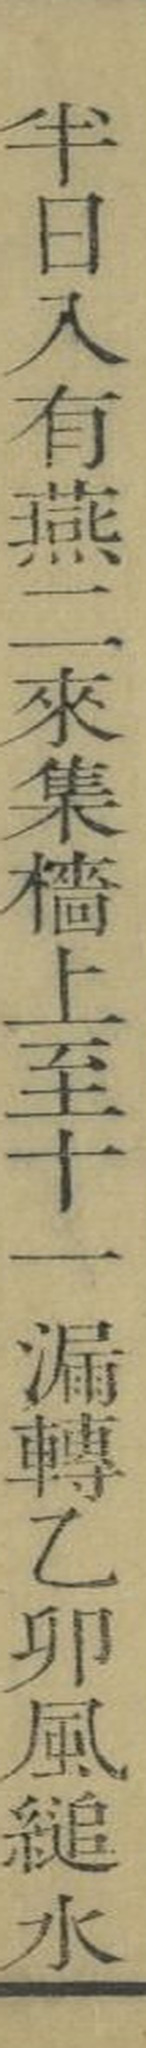半日入有燕二來集檣上至十一漏轉乙卯風縋水
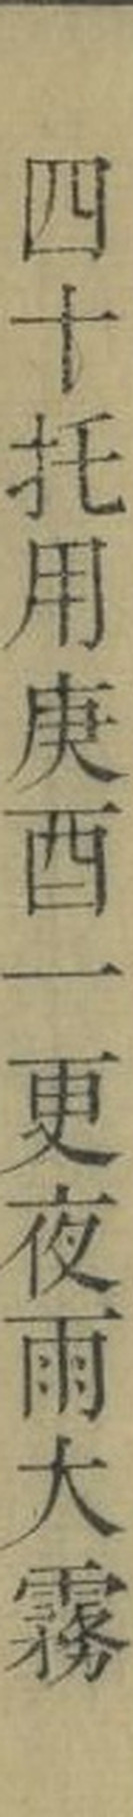四十托用庚酉一更夜雨大霧
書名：中山伝信録 巻一
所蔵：University of the Ryukyus Library
